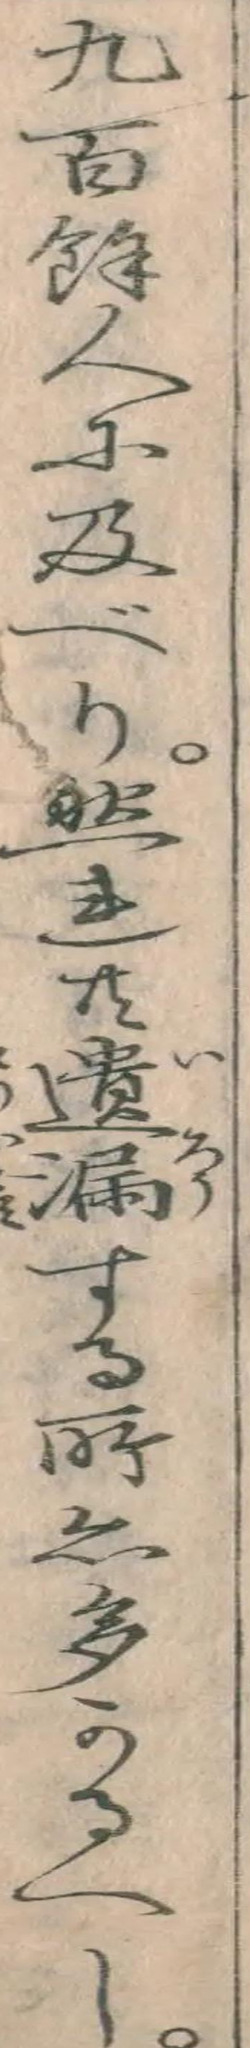九百余人に及べり。然れ共遺漏する所亦多かるへし。
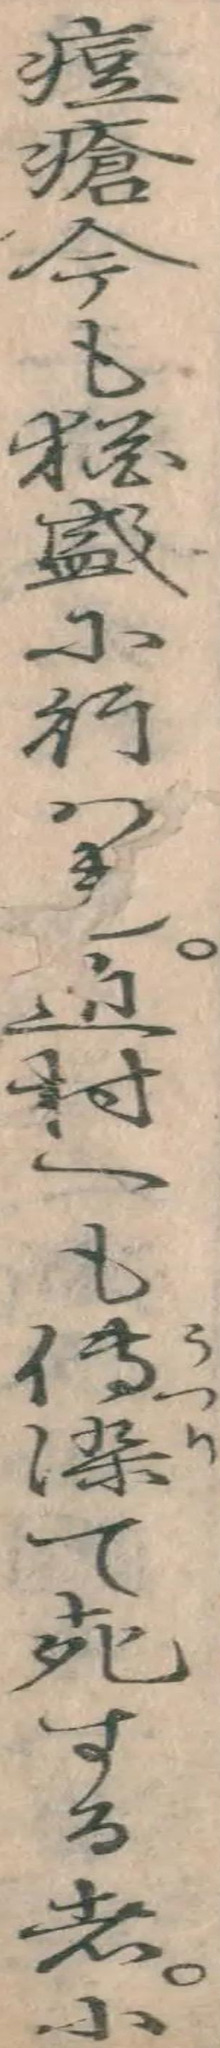痘瘡今も盛に行はれ。近村へも伝染て死する者。小

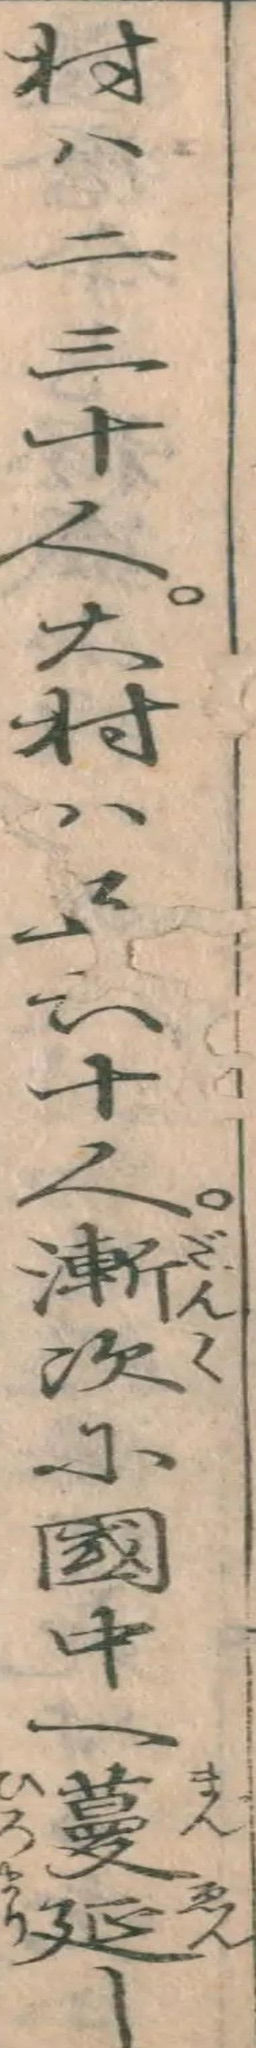村は二三十人。大村は五六十人。漸次に国中へ蔓延し
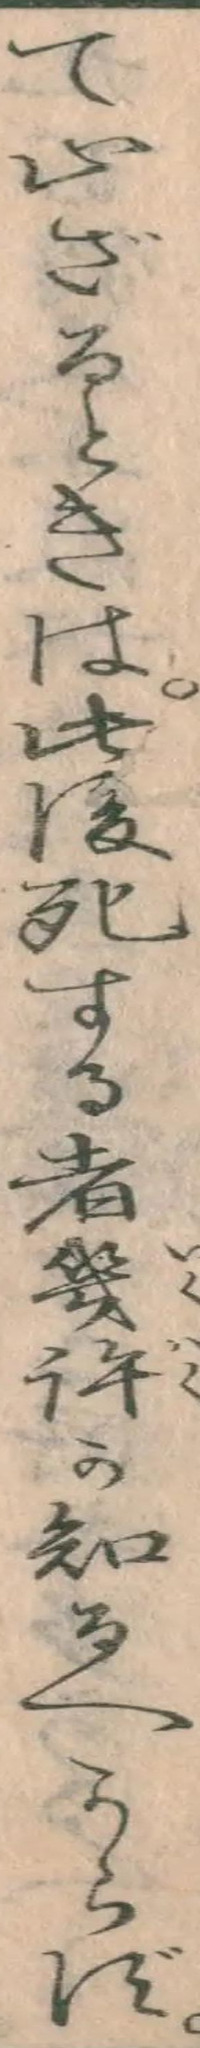て止ざるときは。此後死する者幾許か知るへからず。
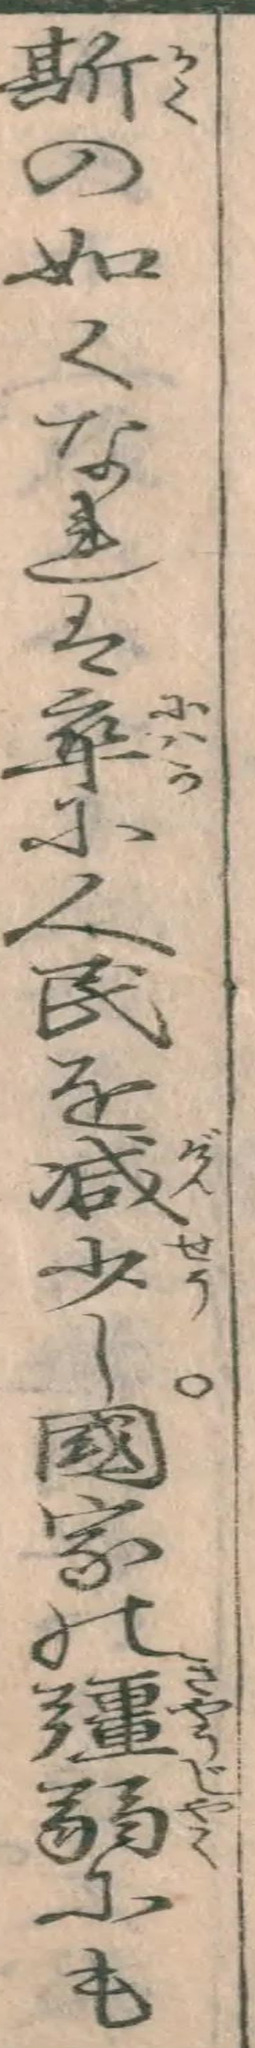斯の如くなれは卒に人民を減少し。国家の彊弱にも
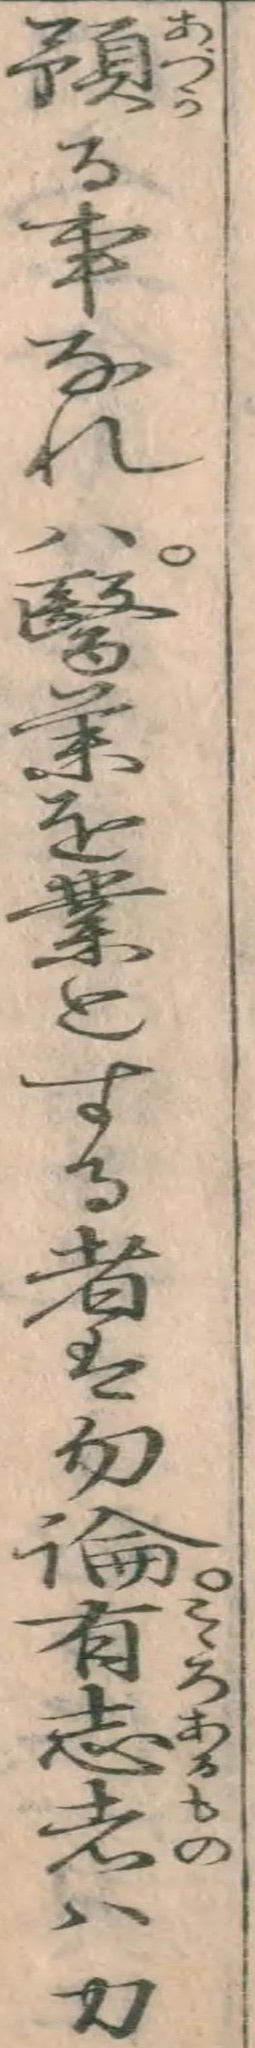預る事なれは。医業を業とする者は勿論。有志者は力
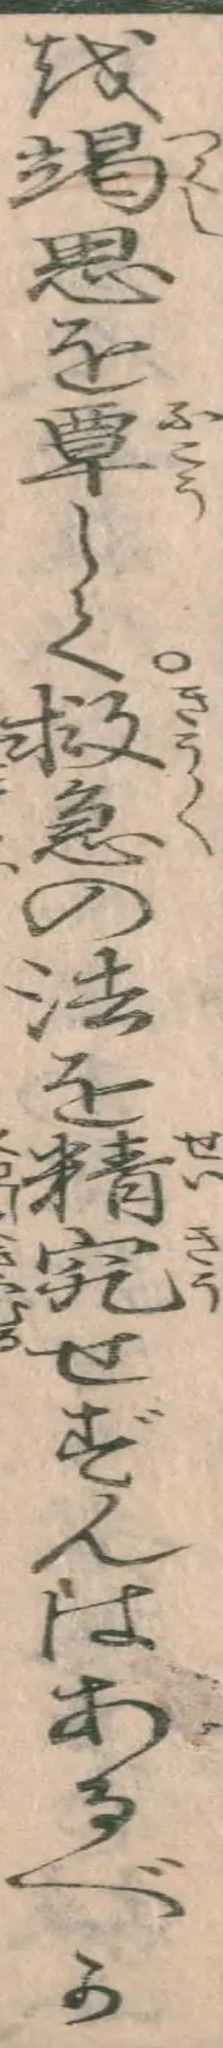を竭思を覃して。救急の法を精究せずんはあるべか
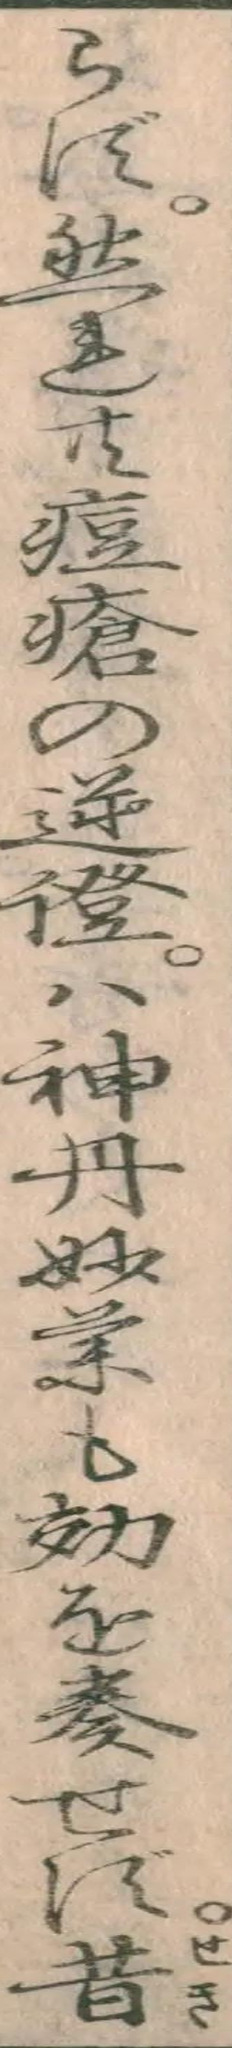らず。然れ共痘瘡の逆証は。神丹妙薬も効を奏せず。昔
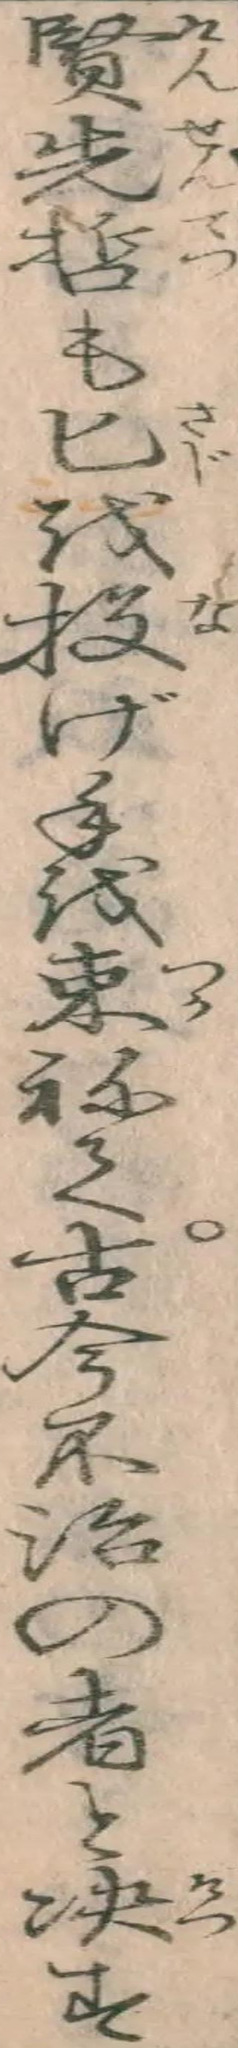賢先哲も匕を投げ手を束ねて。古今不治の者と決す
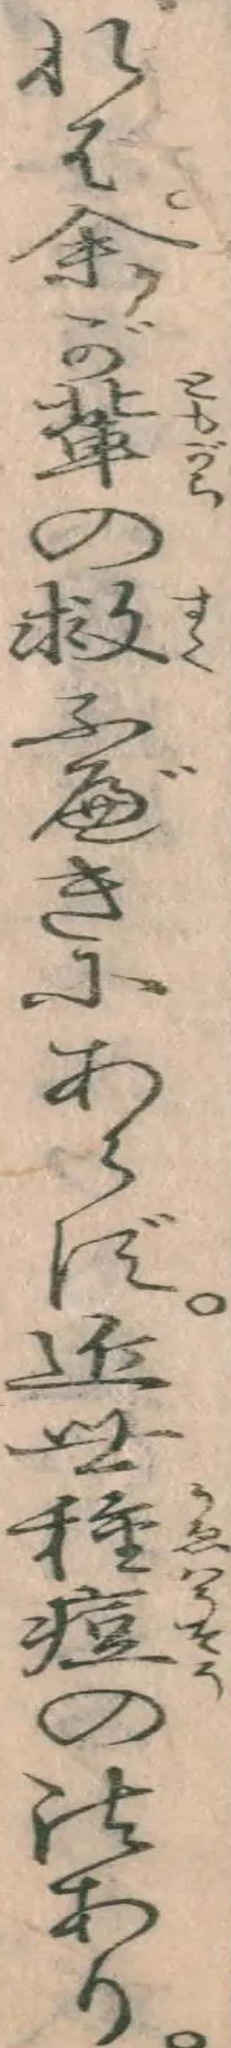れは。余が輩の救ふべきにあらず。近世種痘の法あり。
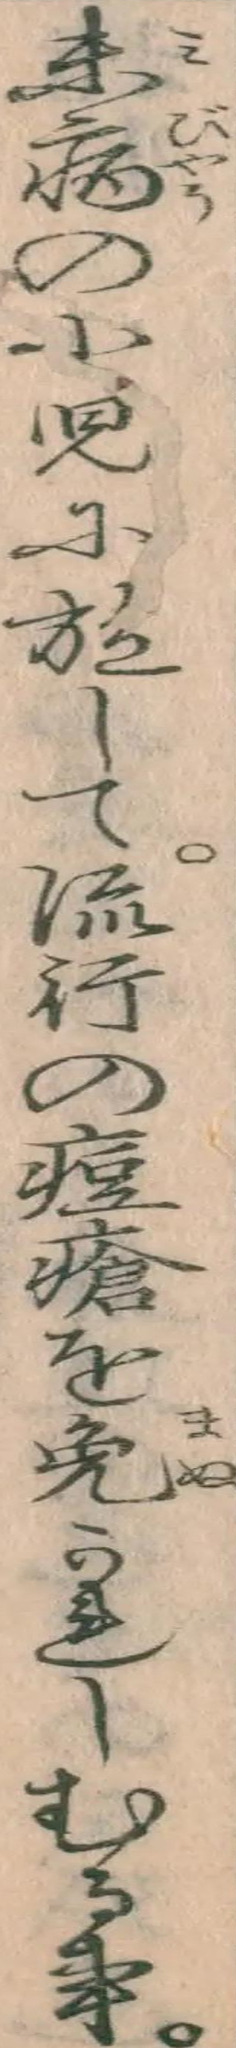未病の小児に施して。流行の痘瘡を免かれしむる事。
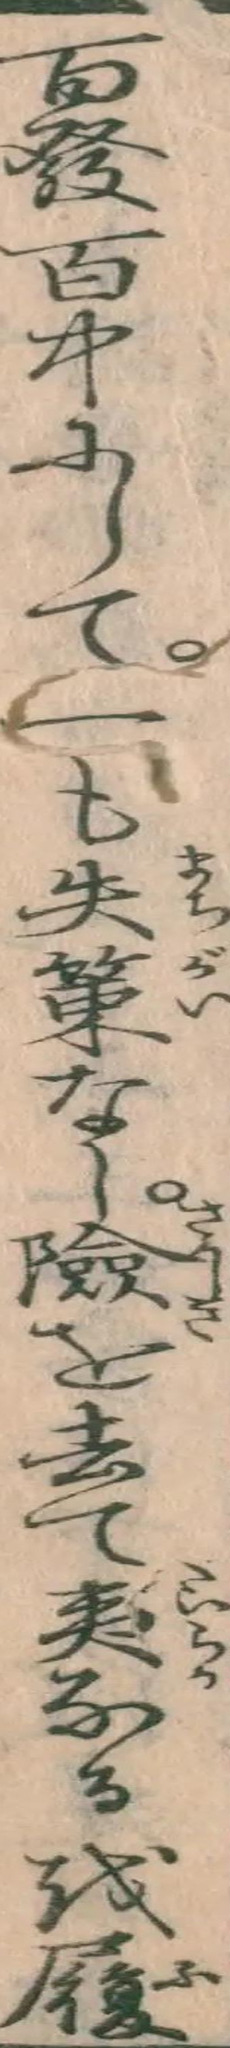百発百中にして。一も失策なし。険を去て夷なるを履
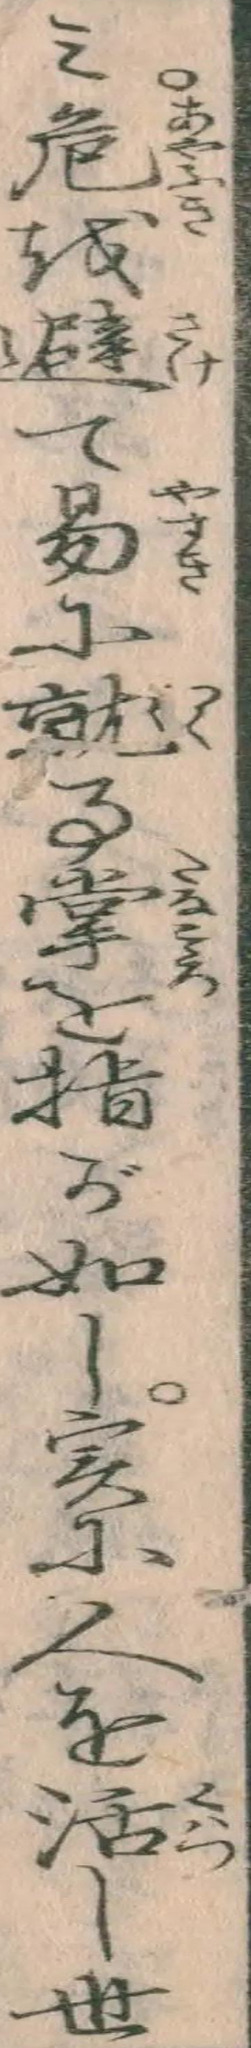み。危を避て易に就事掌を指が如し。実に人を活し世
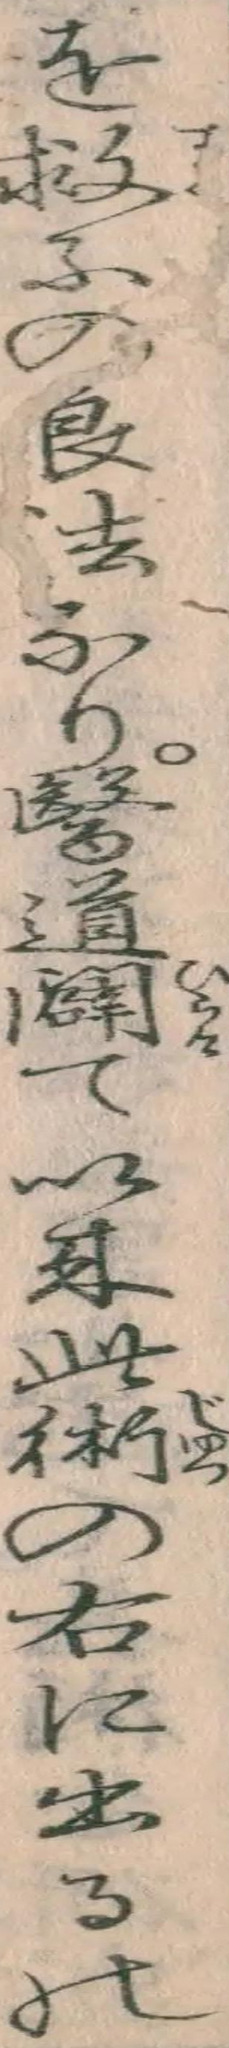を救ふの良法なり。医道闢て以来此術の右に出るの
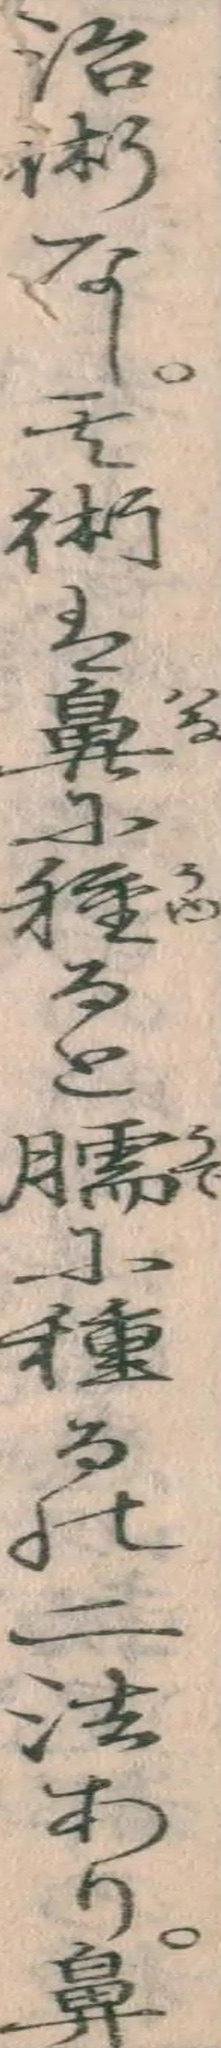治術なし。其術は鼻に種ると臑に種るの二法あり。鼻
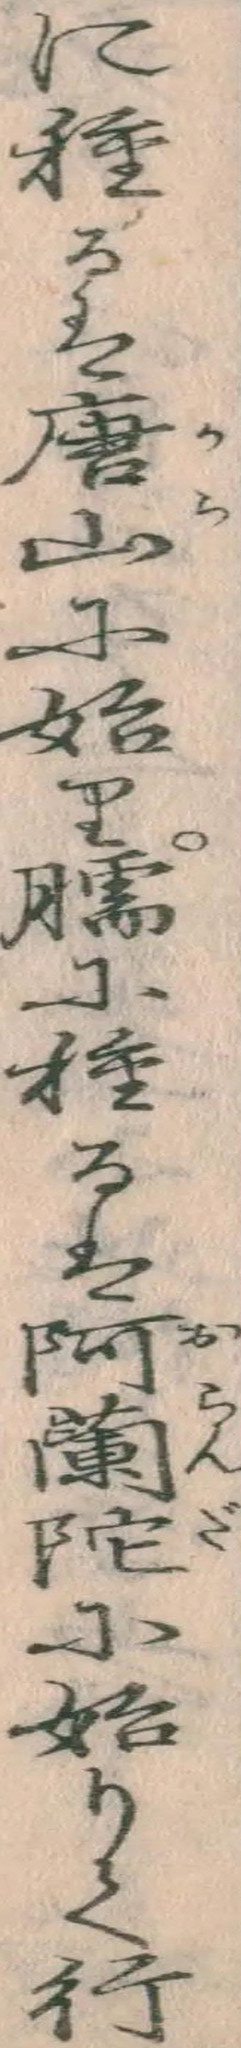に種るは唐山に始り。臑に種るは阿蘭陀に始りて行
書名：種痘活人十全辯
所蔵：国立国会図書館 National Diet Library, JAPAN
